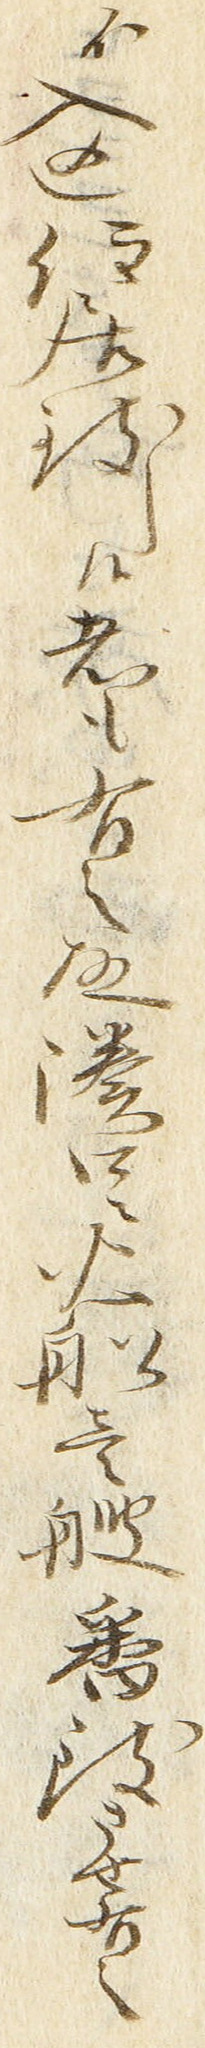ゟ入込住居致し候者も有之故湊口に火船壱艘番致させ有之
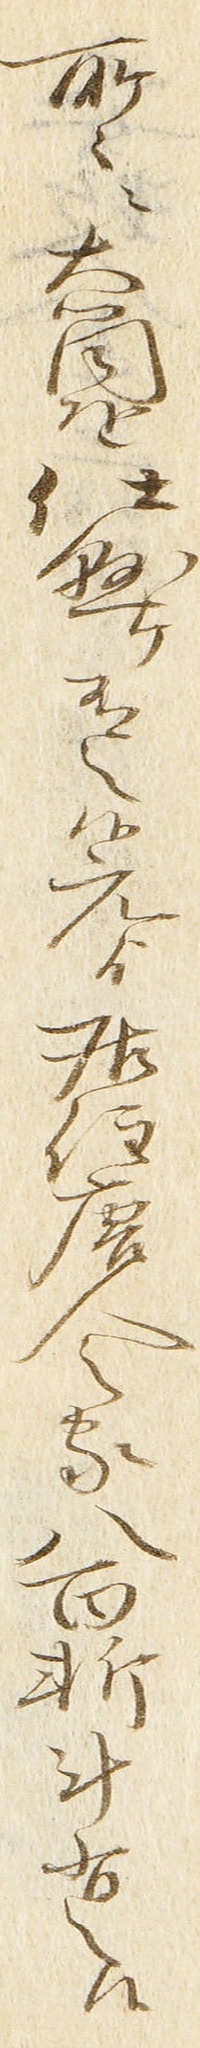所々に大筒を仕懸ケ有之候元ゟ居住唐人之家八百軒斗有之候
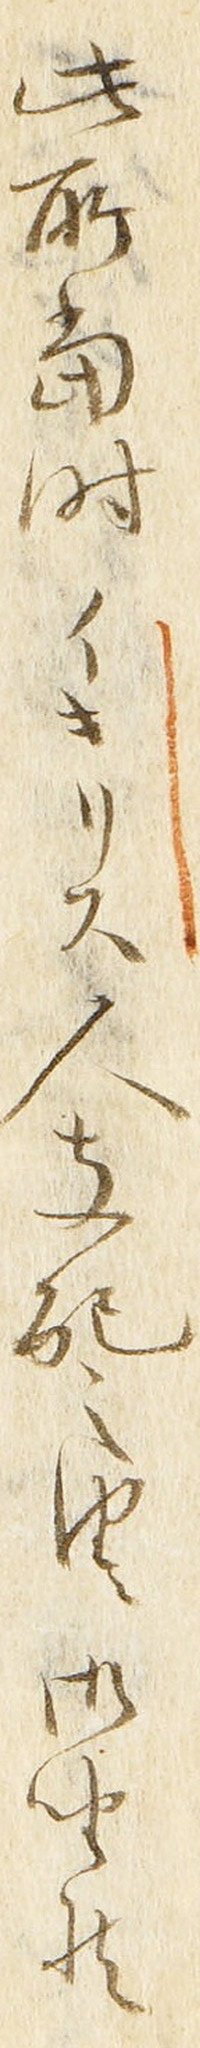此所当時イキリス人支配之由に御座候
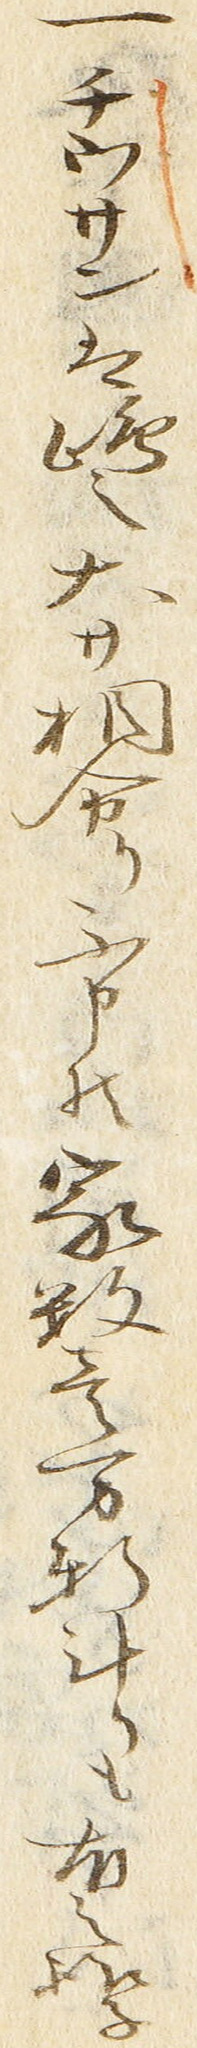一チウサンは嶋之大サ相分り申候家数壱万軒斗りも有之様子
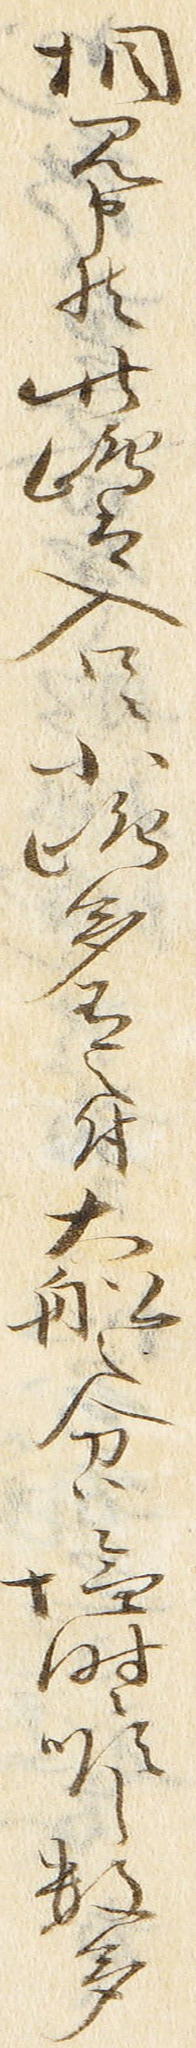相見申候此嶋は入口に小嶋多有之付大船之分は塩時に順し数多
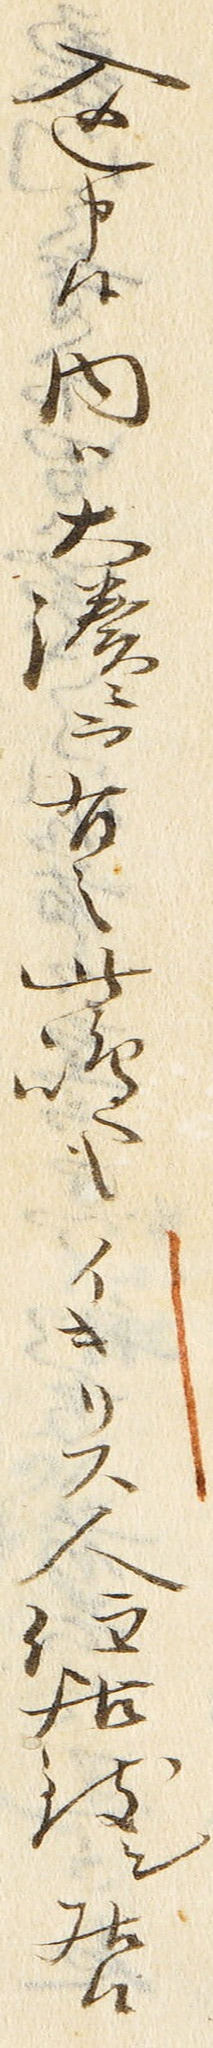入込申候内は大湊に而あ有之此嶋もイキリス人住居致し居候
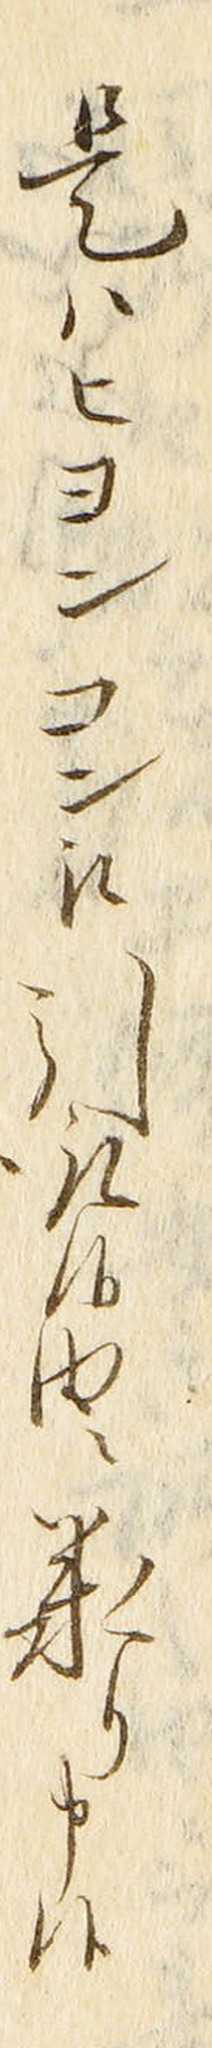是はヒヨンコン江引取候由に承り申候
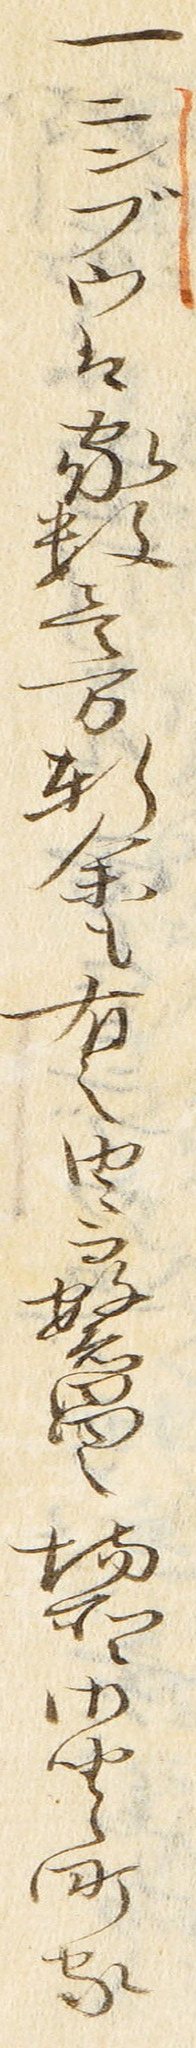一ニンブウは家数壱萬軒余も有之由に而磐昌之場所に御座候町家
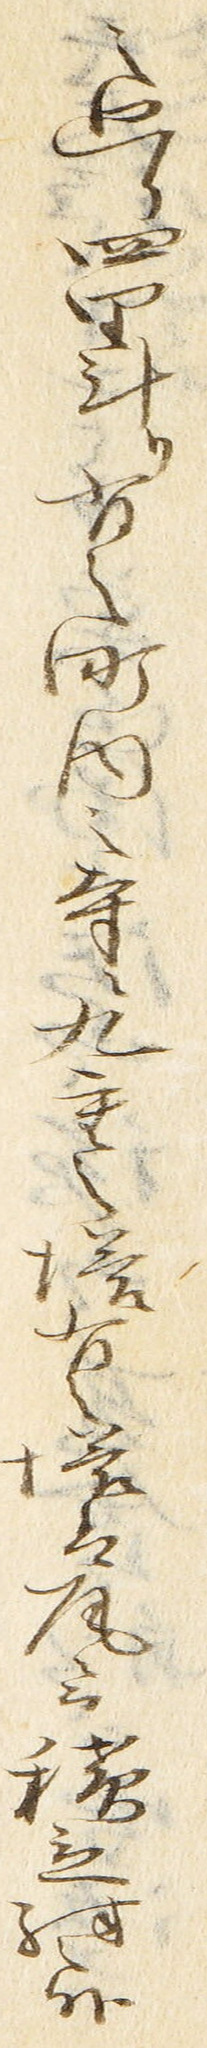之廻り四里斗り有之町内の寺に九重之塔有之塔は瓦に而積立殊之外
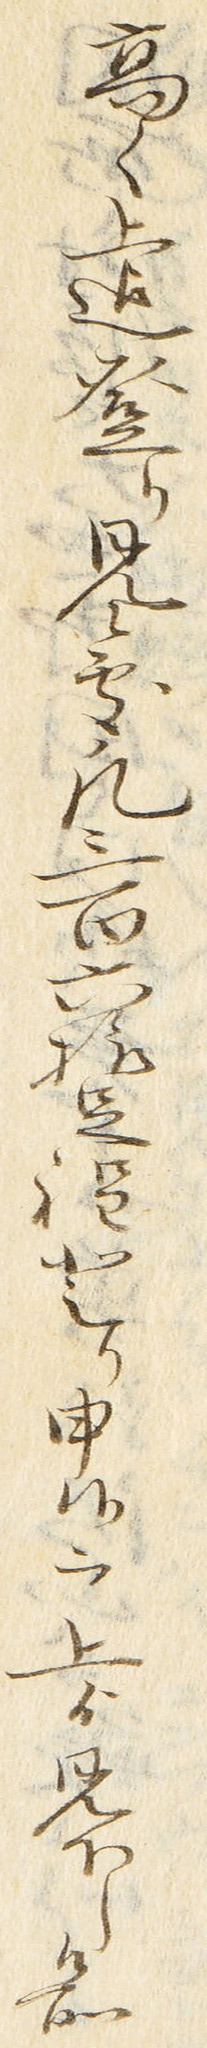高く上迄登り見に處凡三百六拾足程登り申候而上ゟ見下し候所
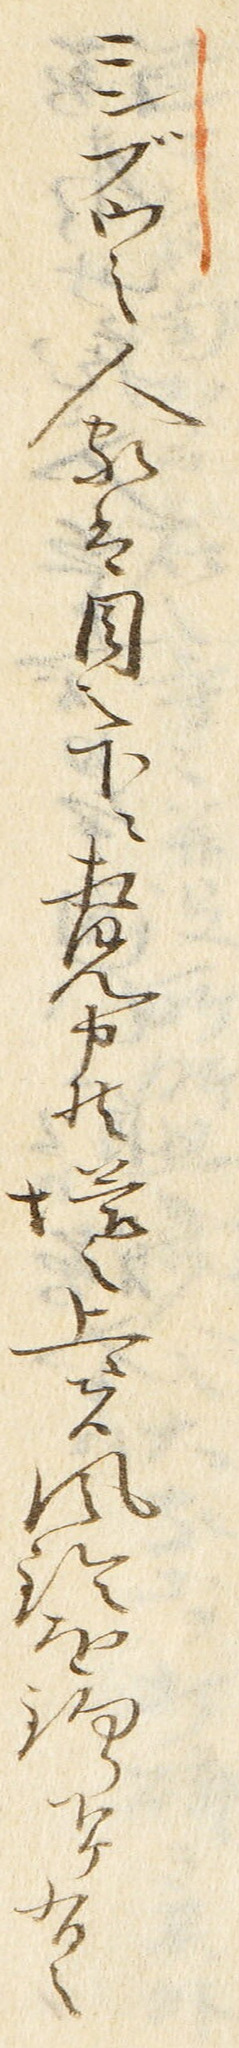二ンブウ之人家は目の下に相見申候塔の上には風鈴を釣り下ケ有之
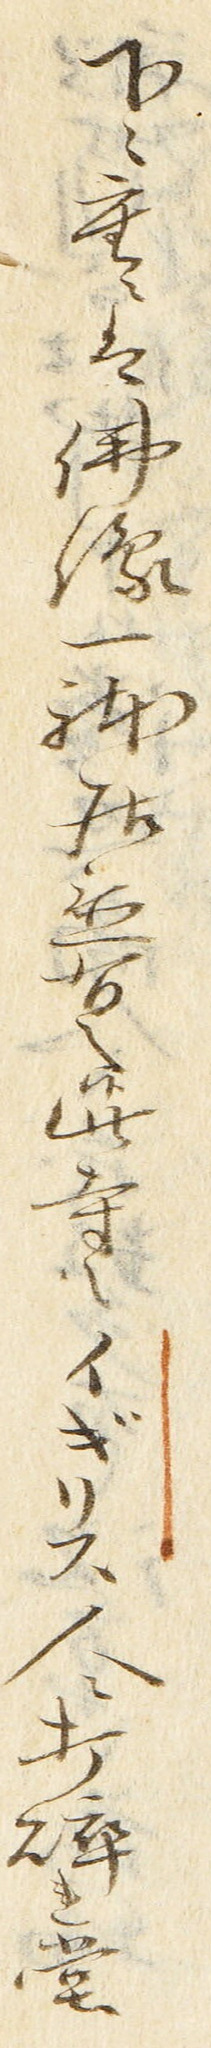下之重には仏像一躰居置有之候此寺之イギリス人に打砕れ堂
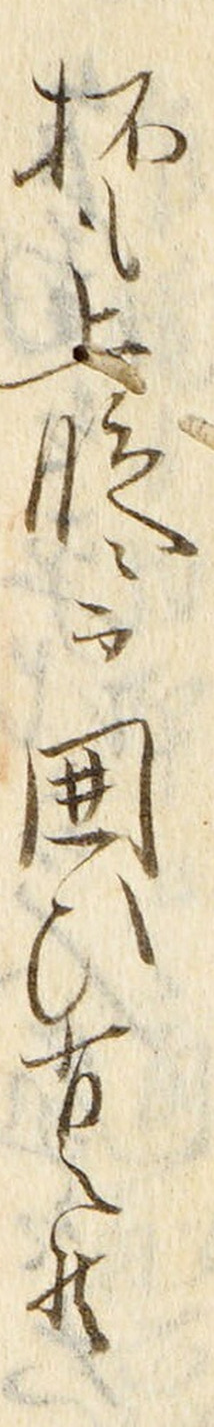抷も上段に而囲ひ有之候
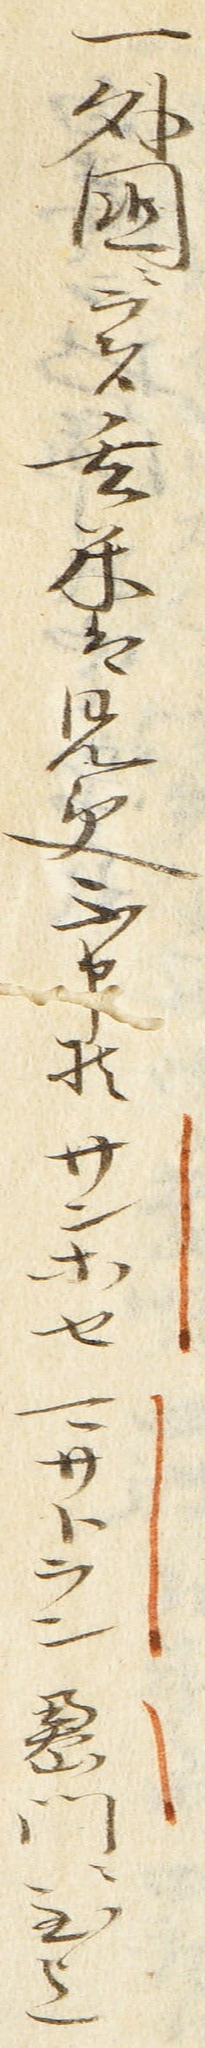一外国に而は玄米は見受不申候サンホセマサトラン嶴門に至迠

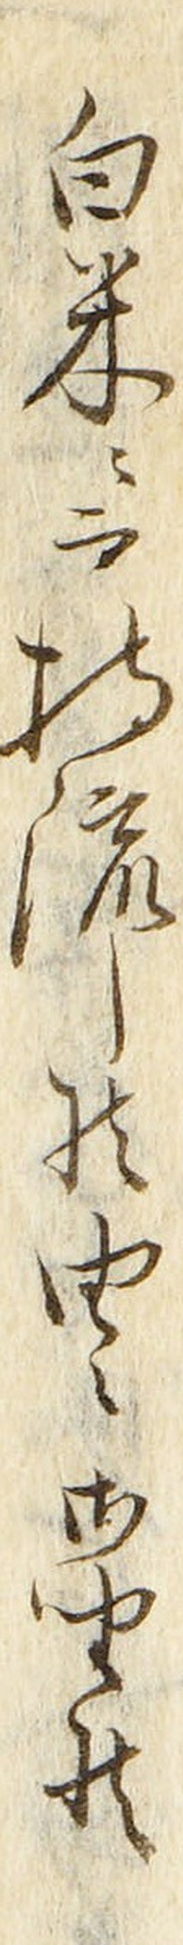白米に而持流し候由に御座候
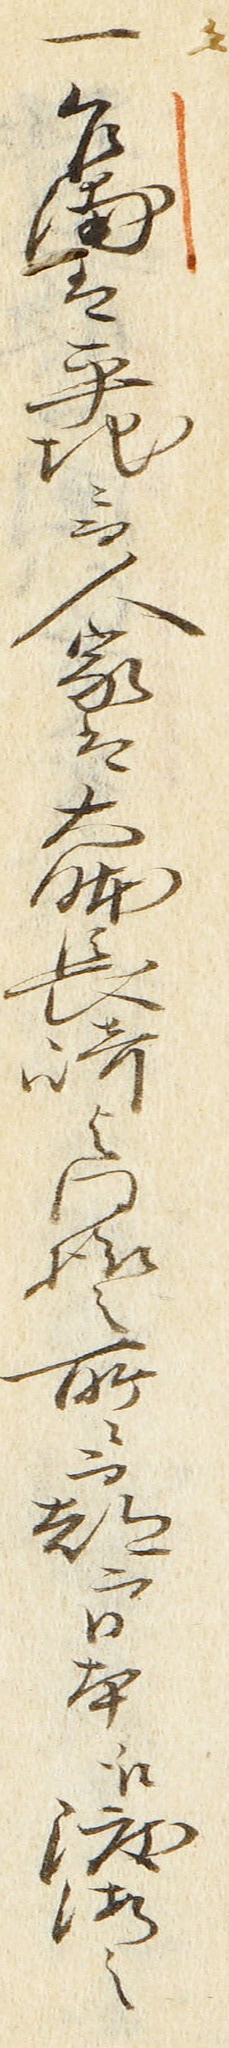一乍浦は平地に而人家は大躰長崎と同様の所に而都而日本江渡海之
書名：長崎漂流記
